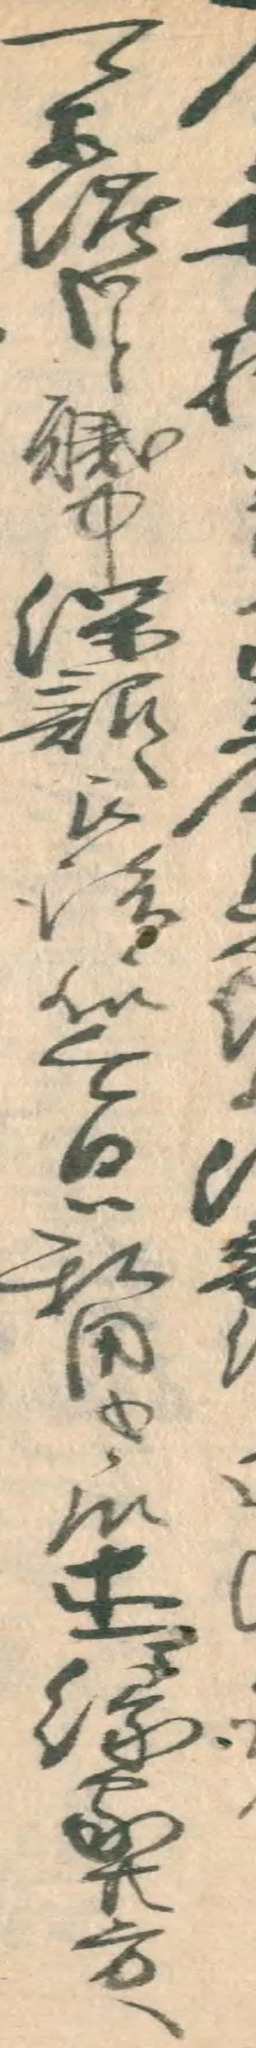可相催哉と職中保韶へ被談候処今日ハ私用も候故直ニ縁家共方へ
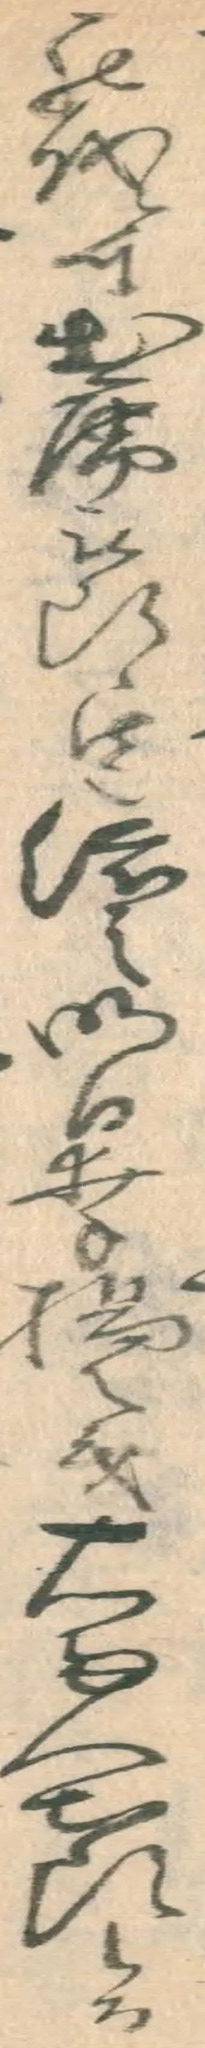罷越候付出席被断候由也依之明日井手揚之義右両人出頭候而
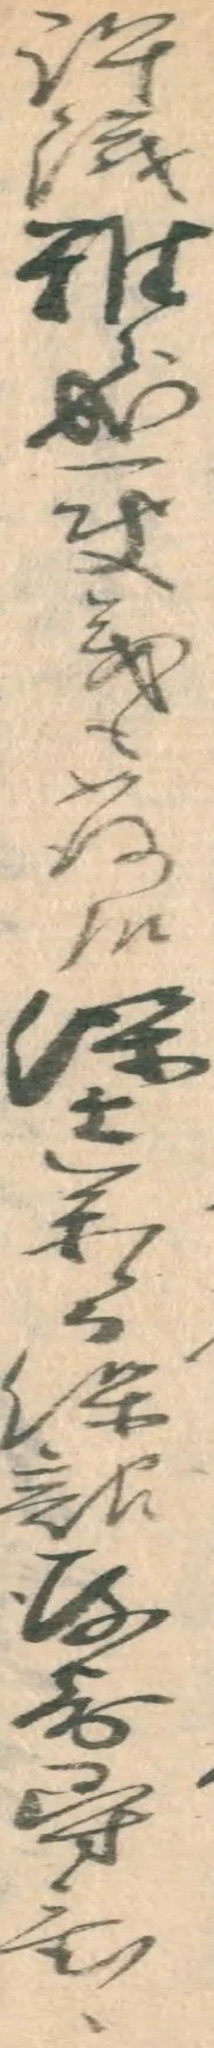評議難被成一決義も如何故保土参候而保韶存寄尋置候
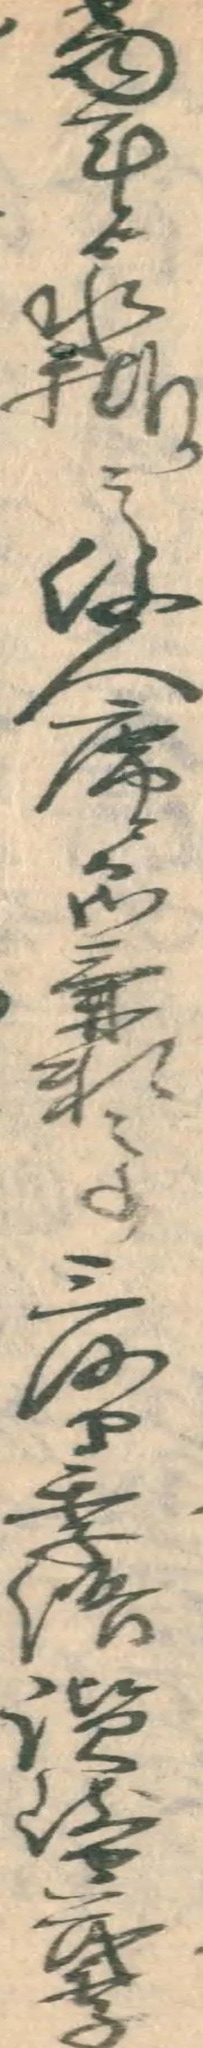当年ゟ水掛り之役人席ニ而御兼頼之事三河守季脩讃岐守茂季
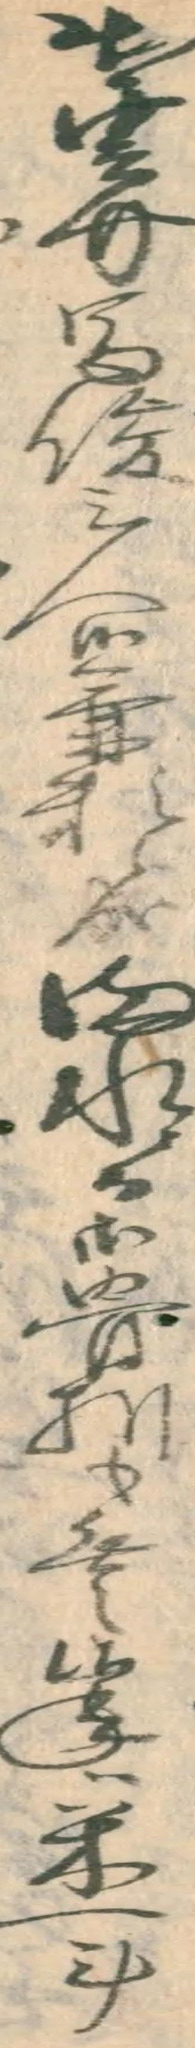出雲介富俊三人御兼頼被成満水ニ而御骨折も無之候年ハ米一斗
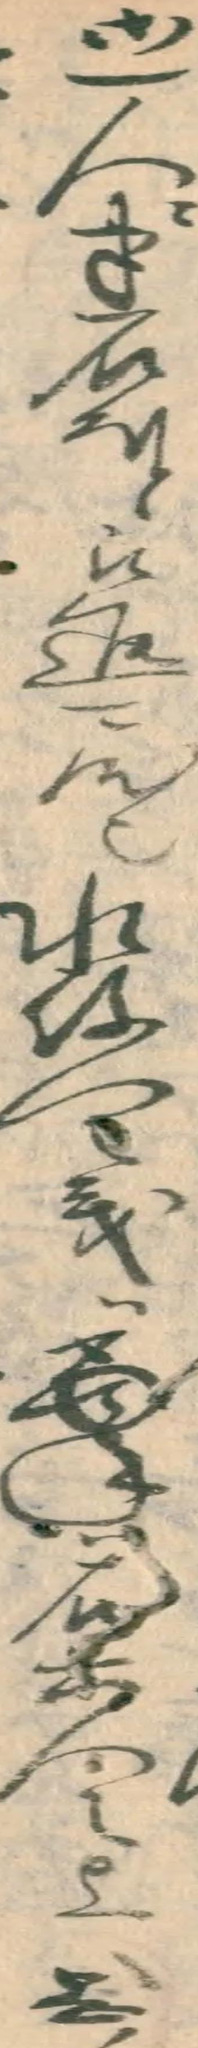御一人ニ半石ほと被進可然也水役人之義ハ当年ハ右六人之上へ岡ノ
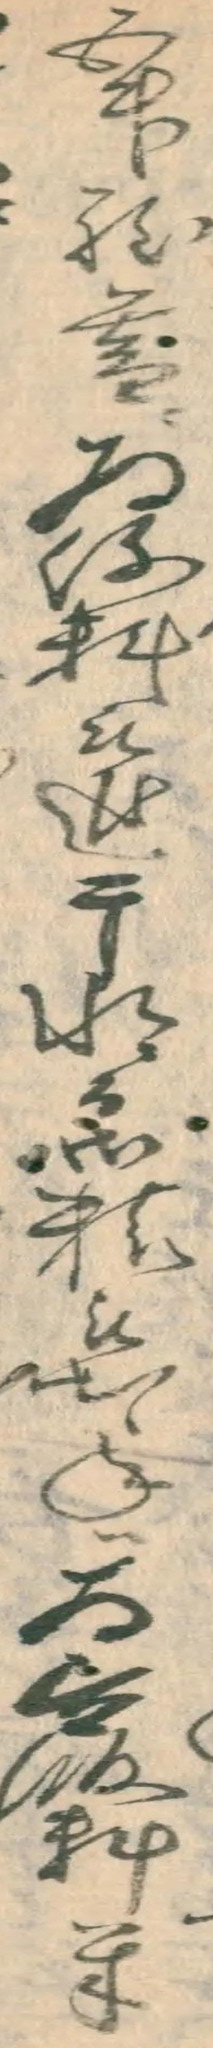五升程暮ニ為役料被進干水ニ而御精被出候年ハ為昼飯料米
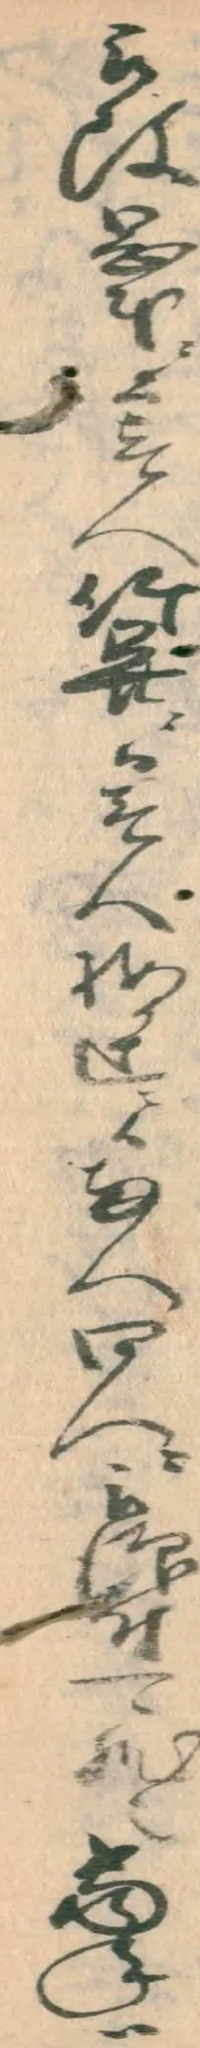被改岡本ニ而壱人竹鼻ニ而壱人梅か辻ニ而両人四人ニ被仰付可然也当年ハ
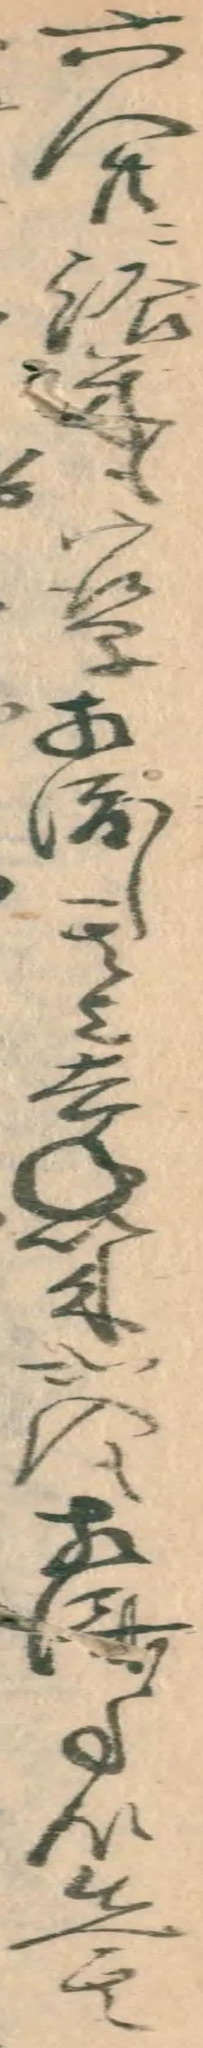六人共ニ給米も最早相渡し其上去年以来出入も相済候事故先其
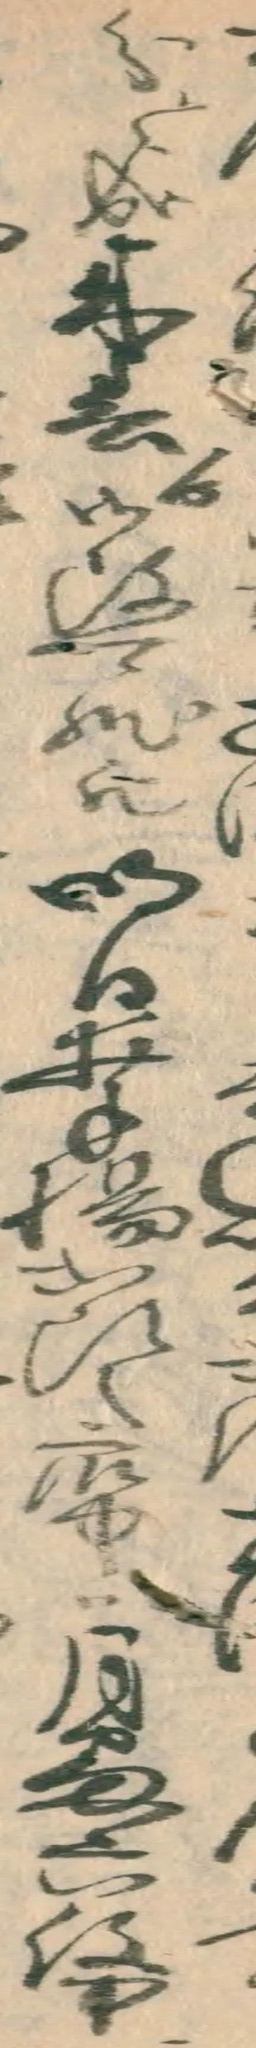分ニ被成来春ゟ御改可然候明日井手揚出頭之衆中ハ月番六役中ニ
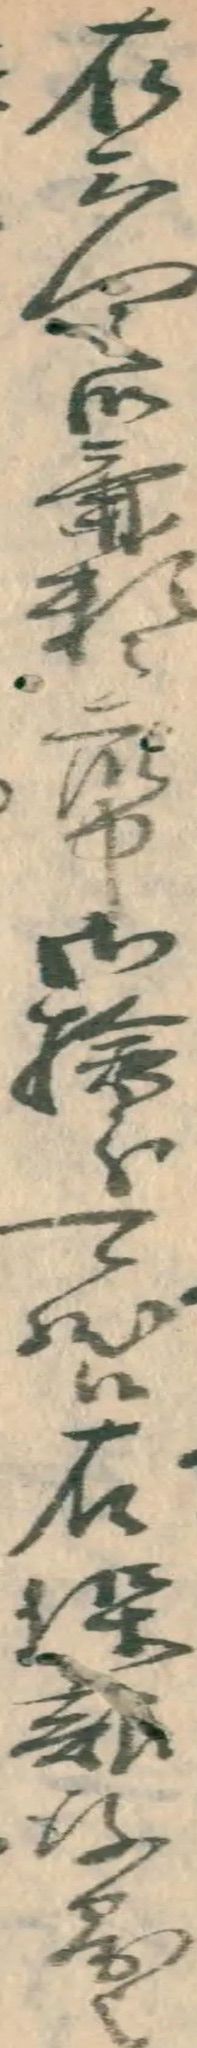右三人之御兼頼之衆中御検分可然候右保韶存寄也
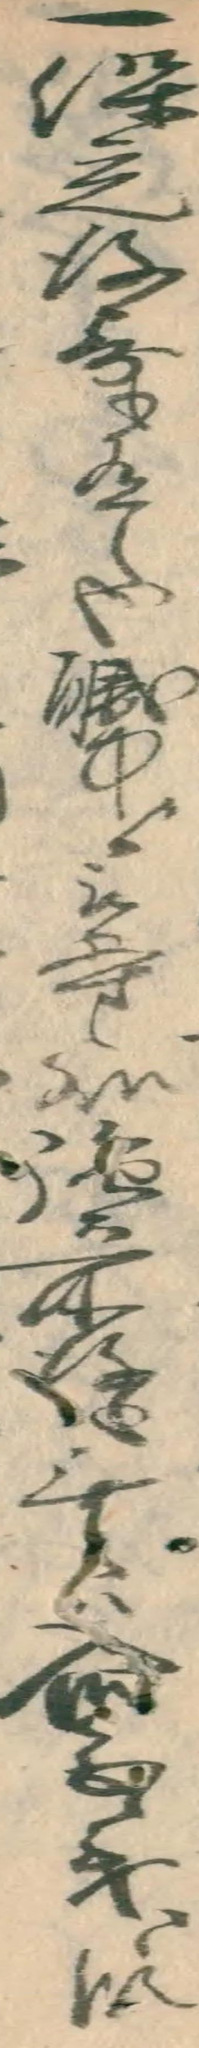一保覚存寄も有之哉職中ゟ被尋候処強而所存も無之ハ入御念義ニ候故
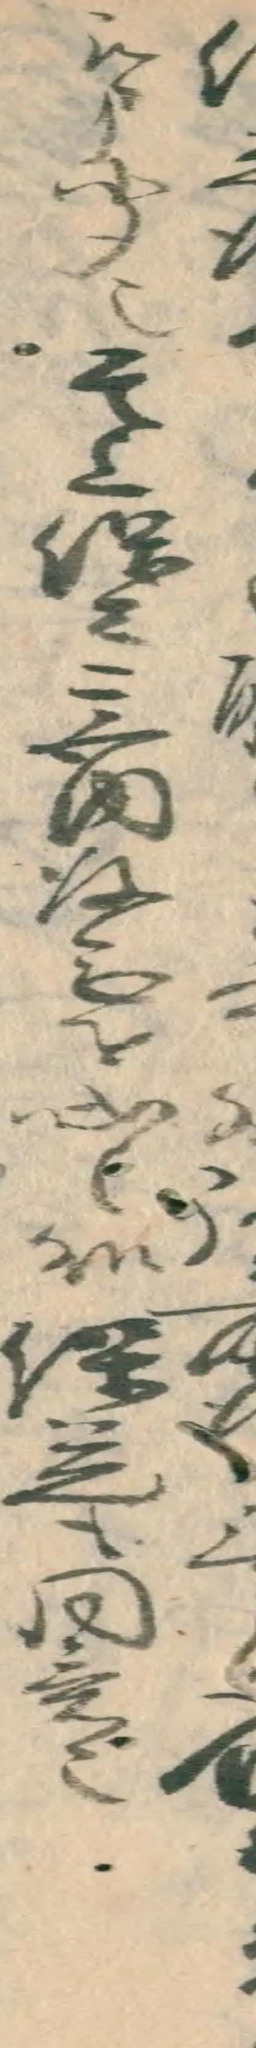被申聞也其上保土宮内存念を咄候処保覚も同意也
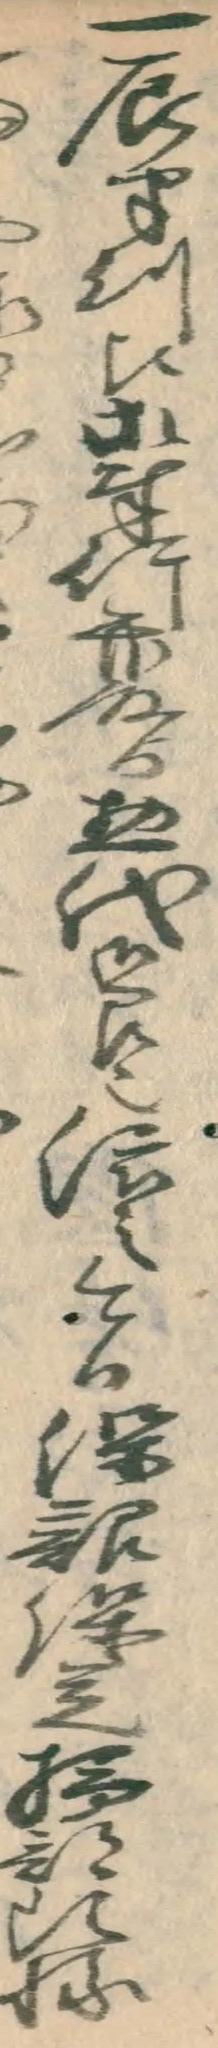一辰半刻比御奉行弁殿ゟ惣代御召也依之今日保韶保覚掃部頭様
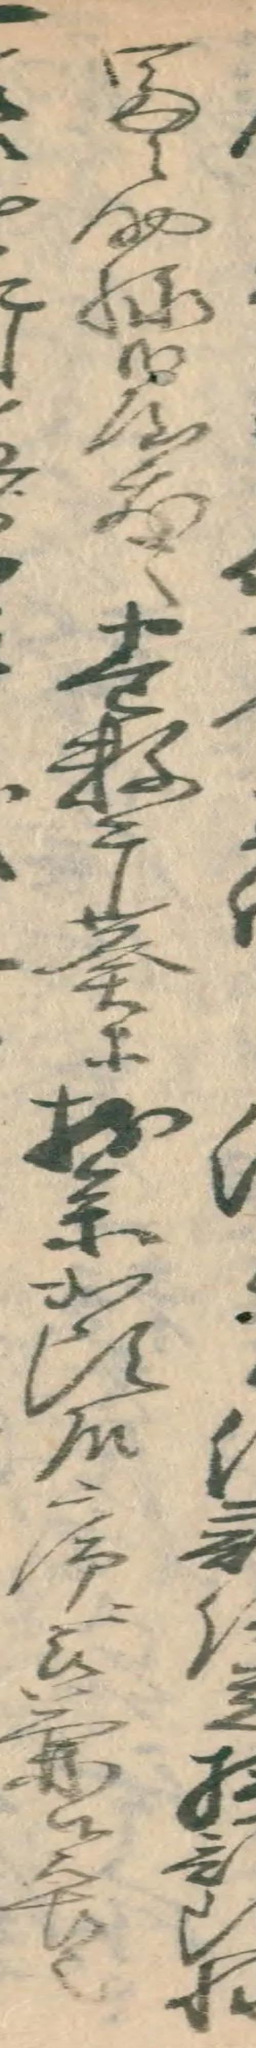冨之助様御屋敷へ巻数干葵等持参出頭故序ニ被兼候筈也
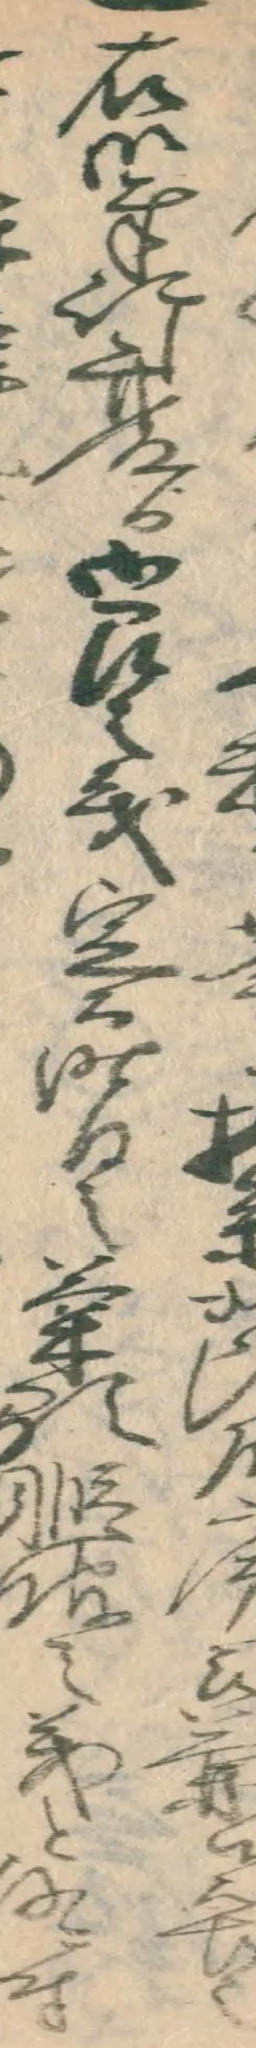一右御奉行弁殿ゟ御召之義定而昨日之菊顕暇服之義と存候ニ付
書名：賀茂社記録. 第58冊
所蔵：国立国会図書館 National Diet Library, JAPAN
